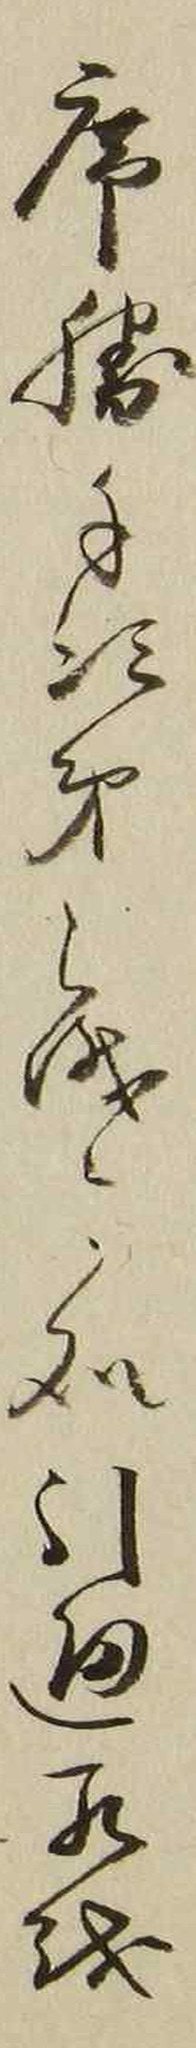席勝手次第之儀ニ候処引廻罷越
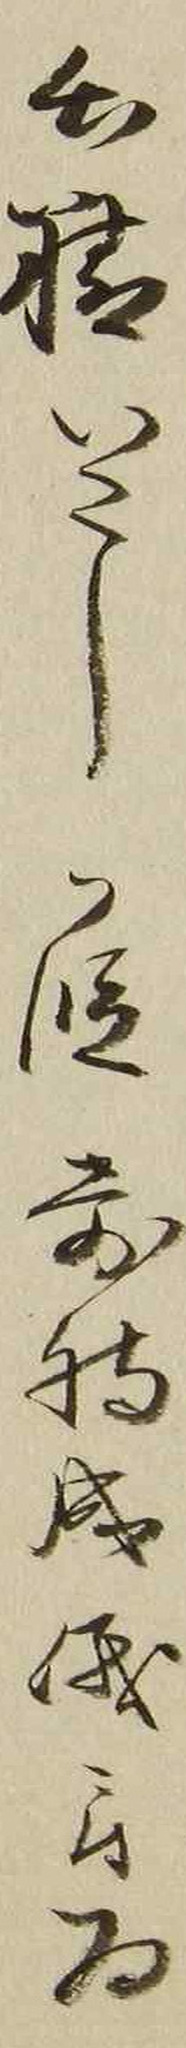出精いたし候段奇特成儀ニ付為
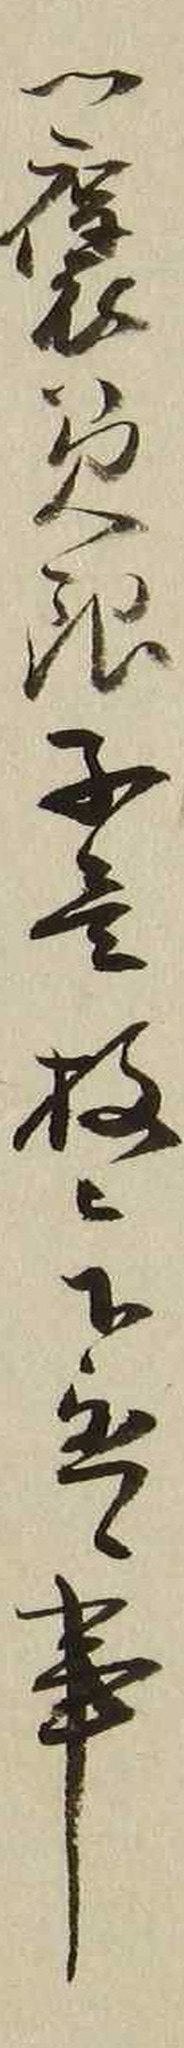御褒美銀子壱枚被下置候事
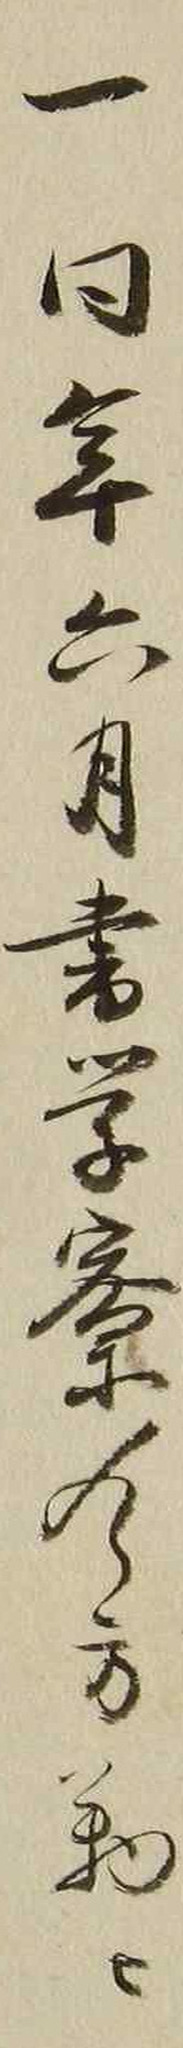一同年六月書学寮〆り方勤被
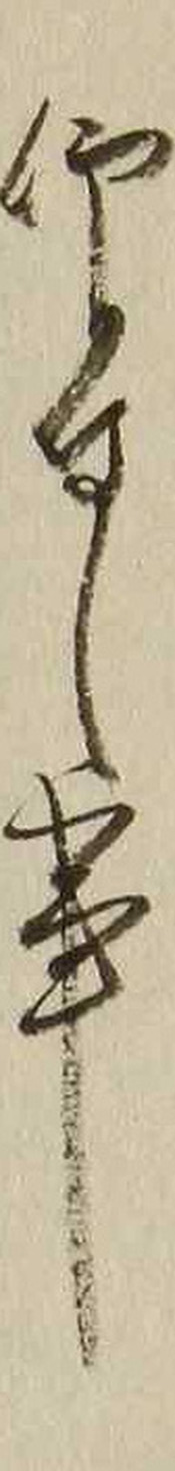仰付候事
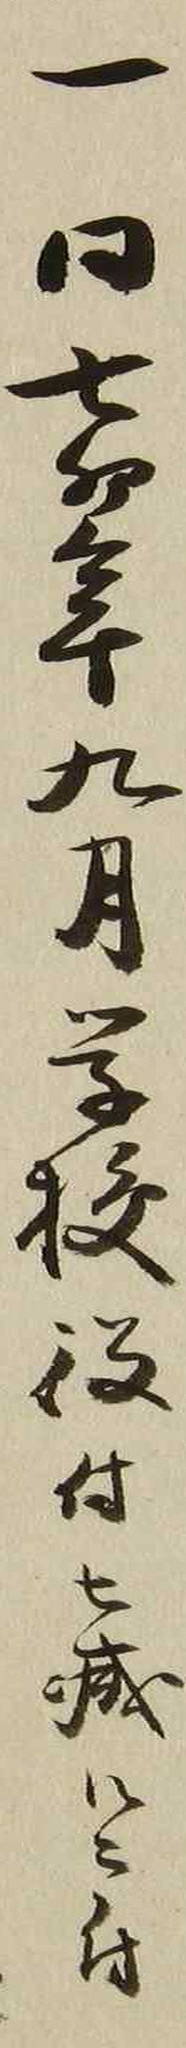一同七卯年九月学校役付被減候ニ付
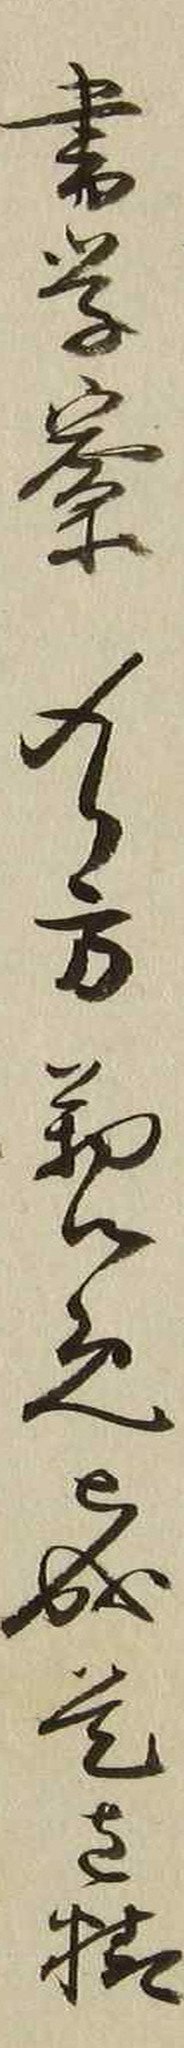書学寮〆り方勤御免被成是迄精
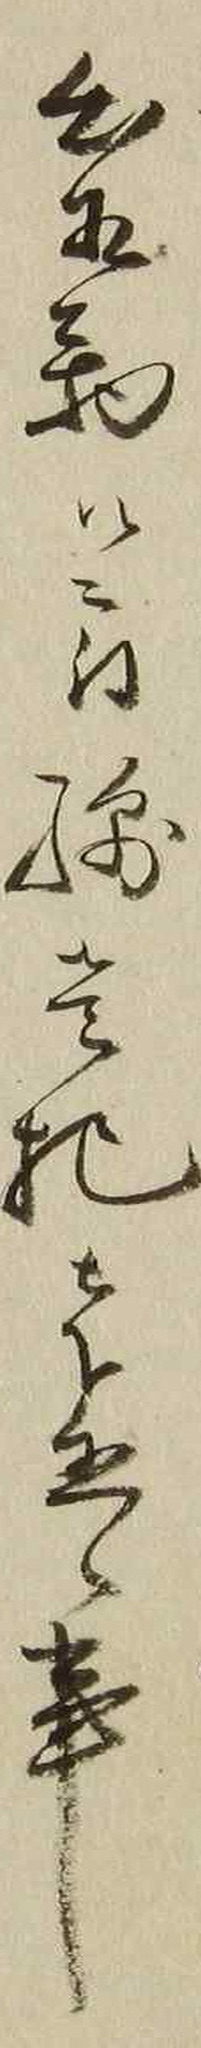出相勤候ニ付綿壱把被下置候事
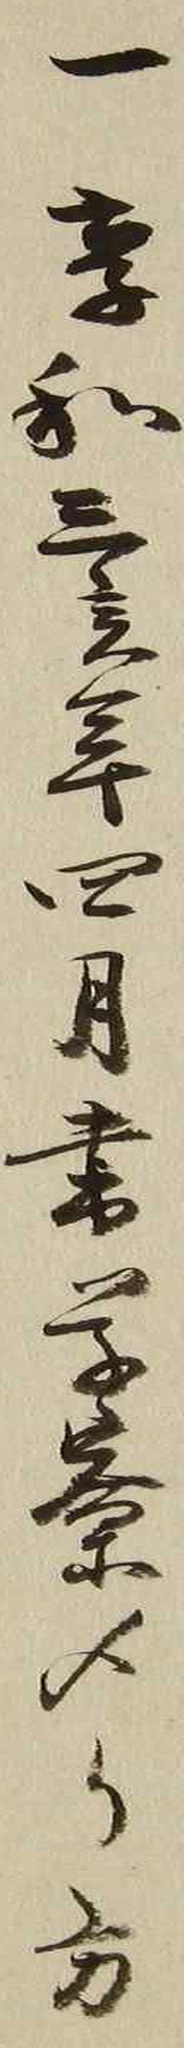一享和三亥年四月書学寮〆り方
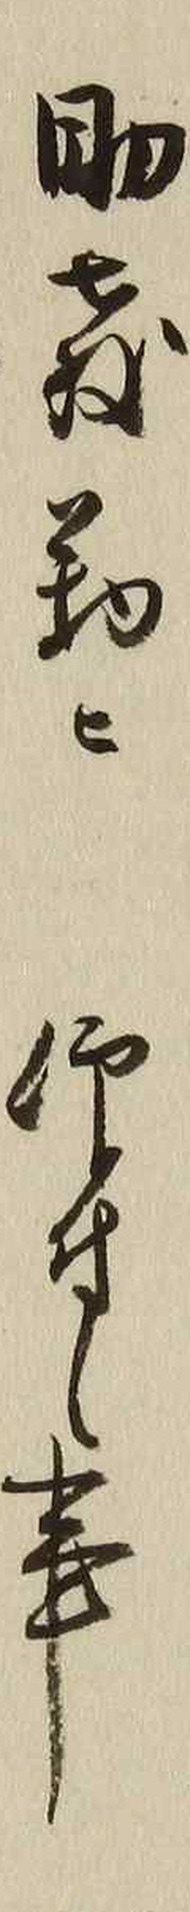助教勤被仰付候事
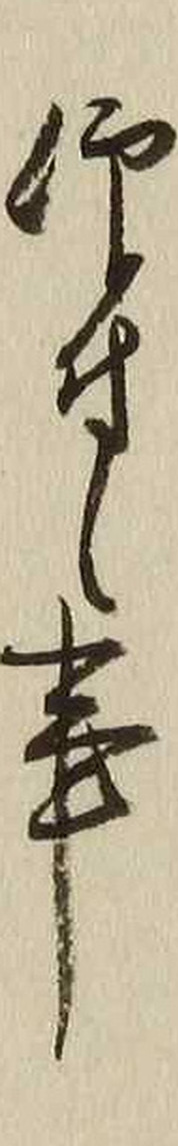仰付候事
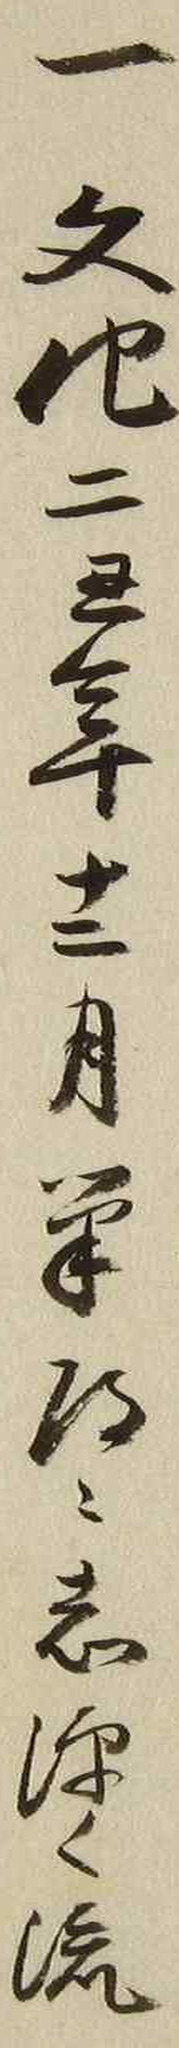一文化二丑年十二月筆道ニ志深く流
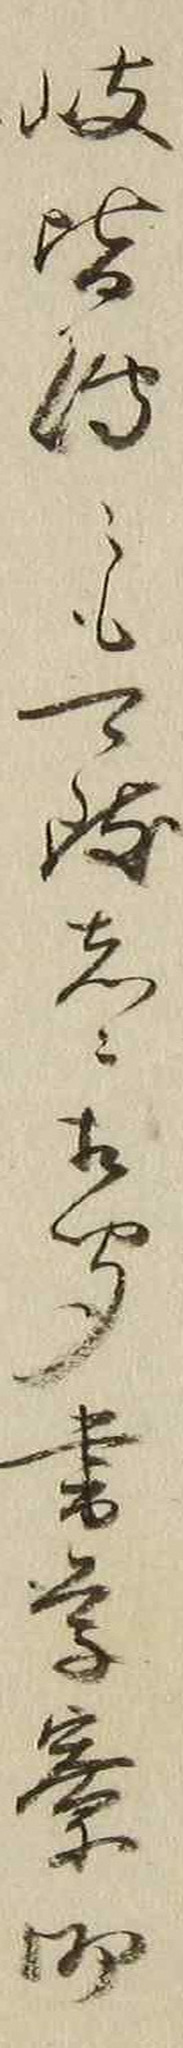岐皆伝ニも可致者ニ相聞書学寮助
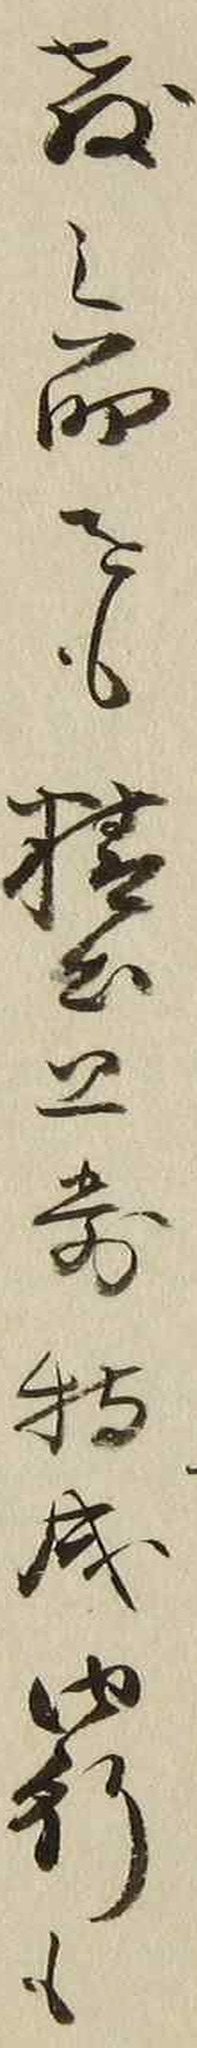教之筋をも精出且奇特成内行も
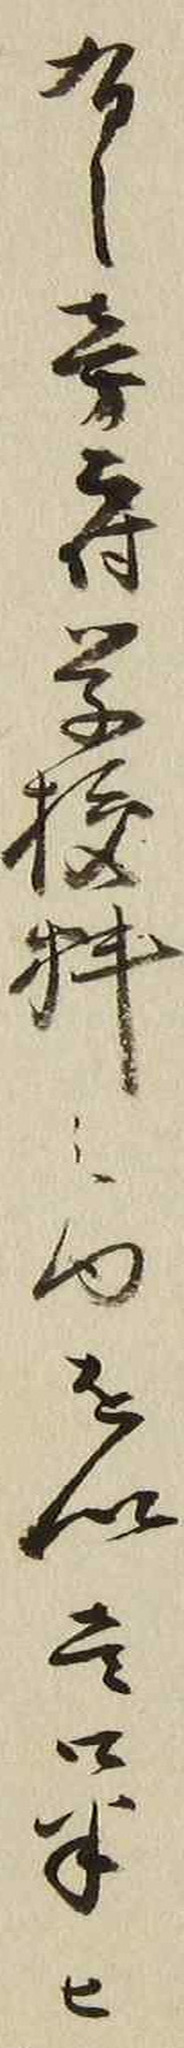有之旁ニ付学校料之内を以壱口半被
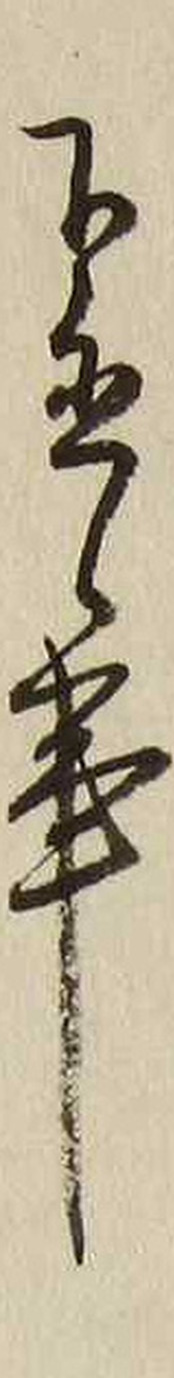下置候事
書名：諸士系譜　巻之288　さ之部20
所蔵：会津若松市立会津図書館
